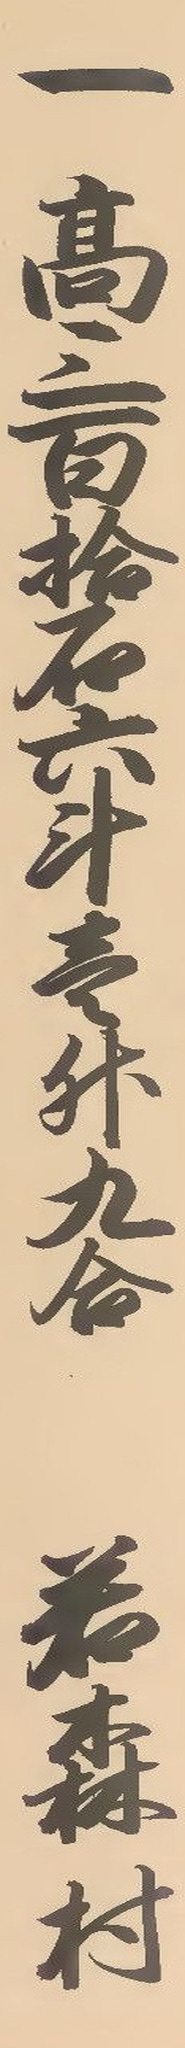一高三百拾石六斗壱升九合若森村
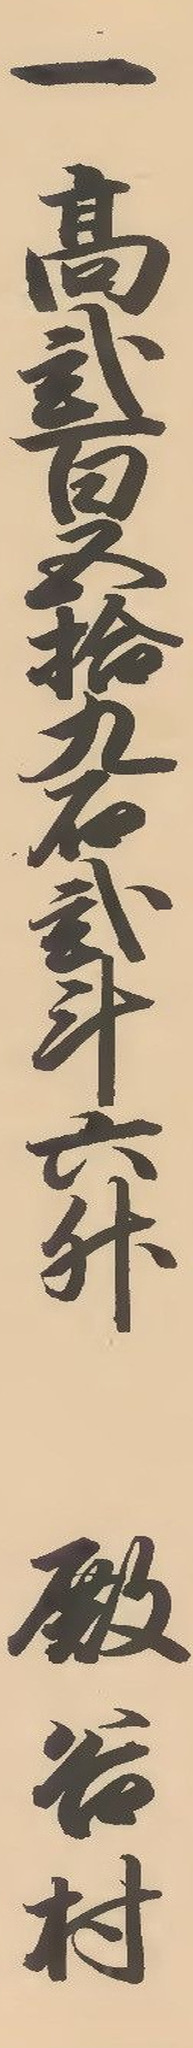一高弐百五拾九石弐斗六升殿谷村
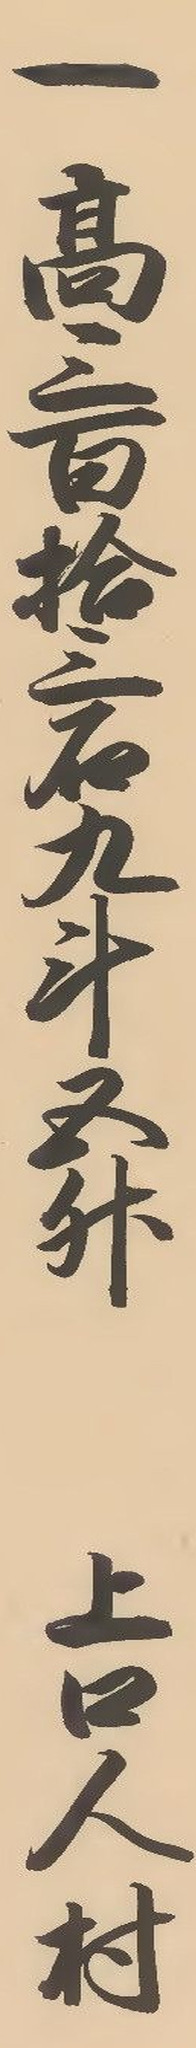一高三百拾三石九斗五升上口人村
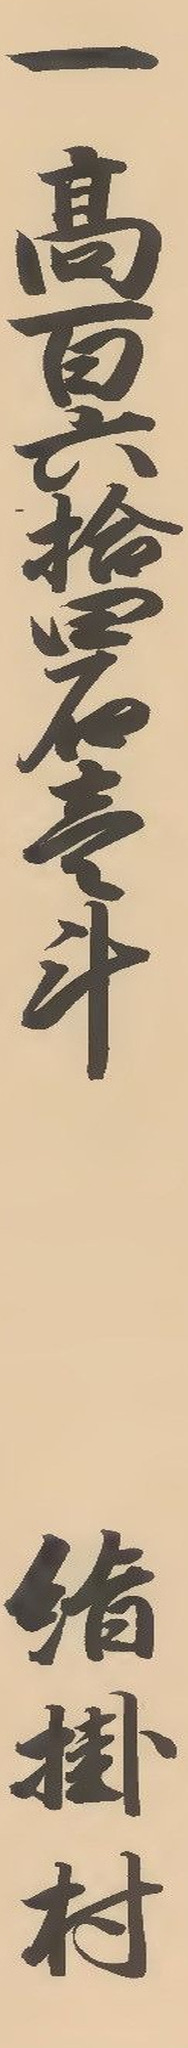一高百六拾四石壱斗絹掛村

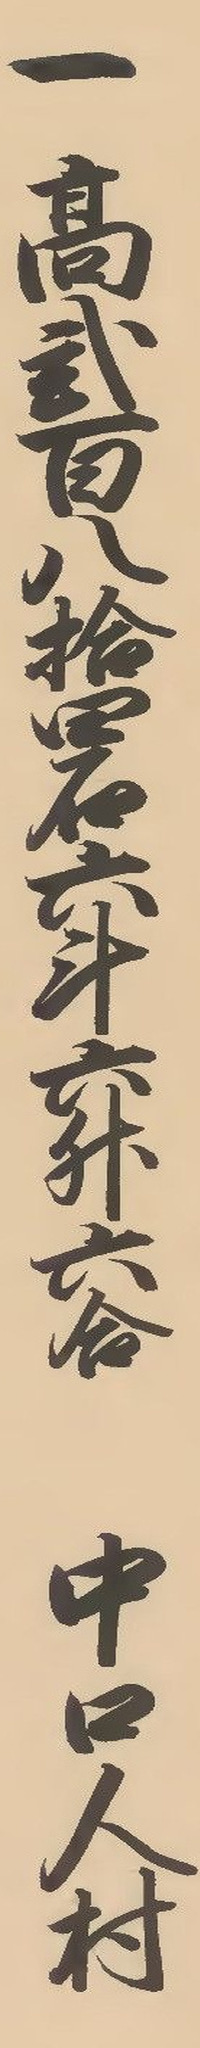一高弐百八拾四石六斗六升六合中口人村
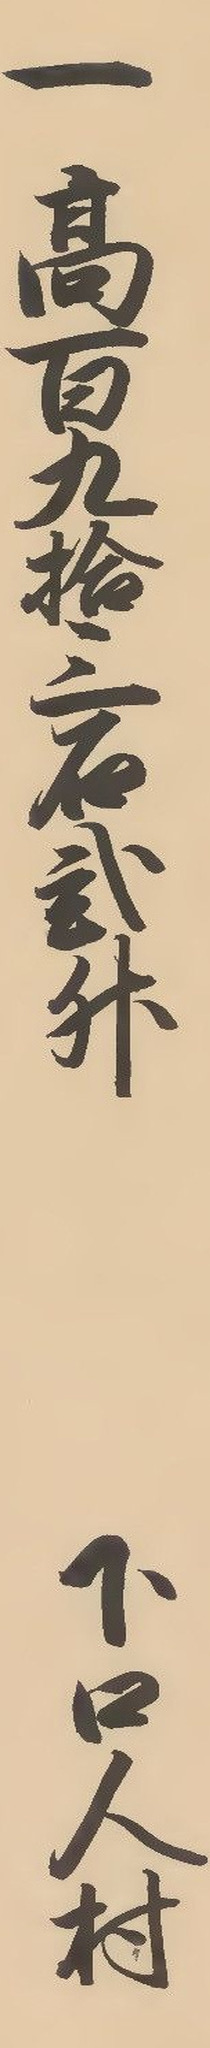一高百九拾三石弐升下口人村
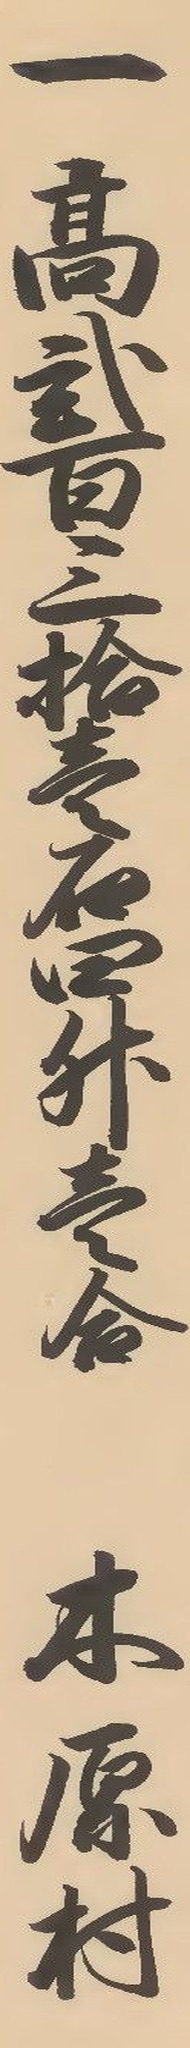一高弐百三拾壱石四升壱合木原村
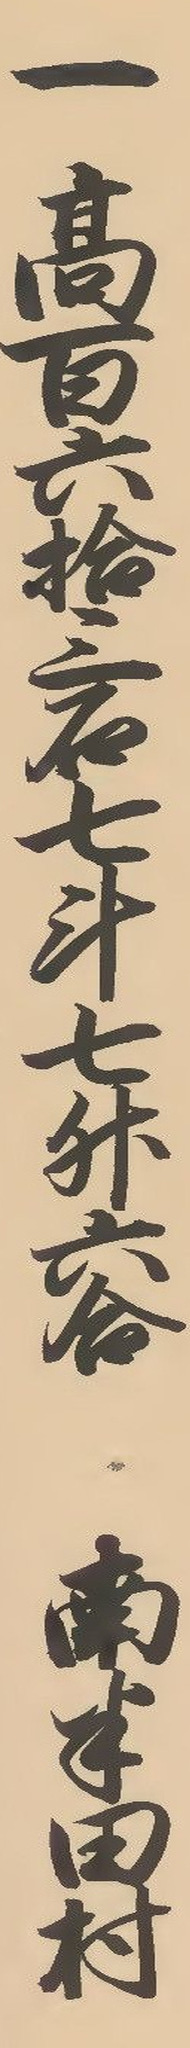一高百六拾三石七斗七升六合南半田村
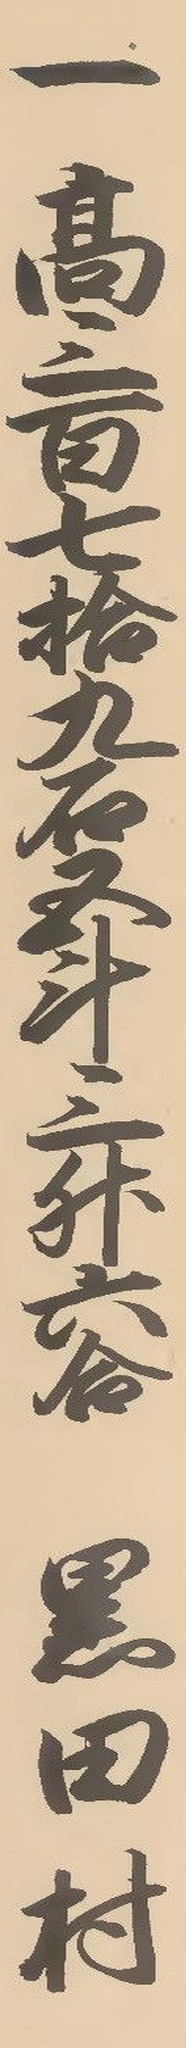一高三百七拾九石五斗三升六合黒田村
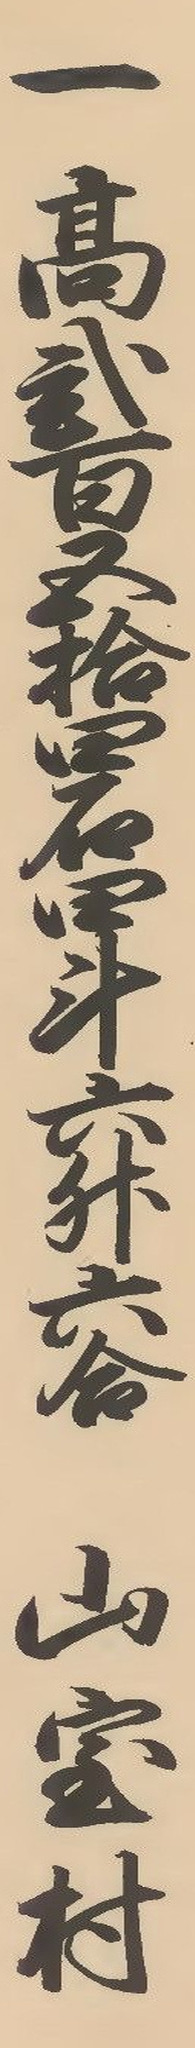一高弐百五拾四石四斗六升六合山室村
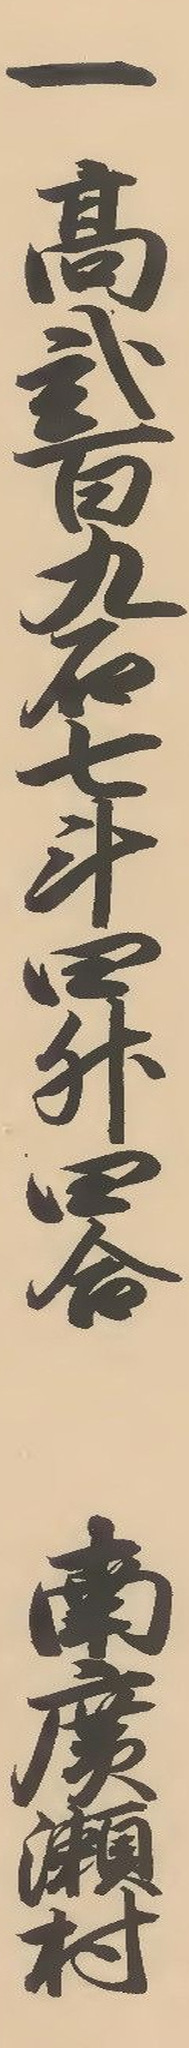一高弐百九石七斗四升四合南広瀬村
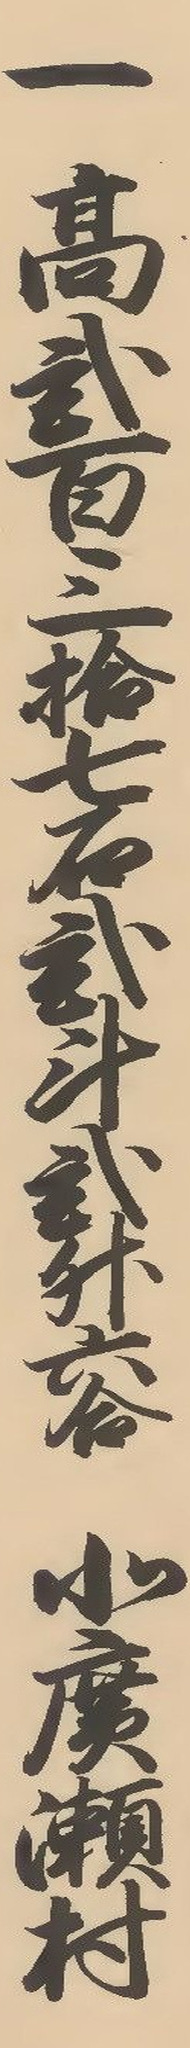一高弐百三拾七石弐斗弐升六合北広瀬村

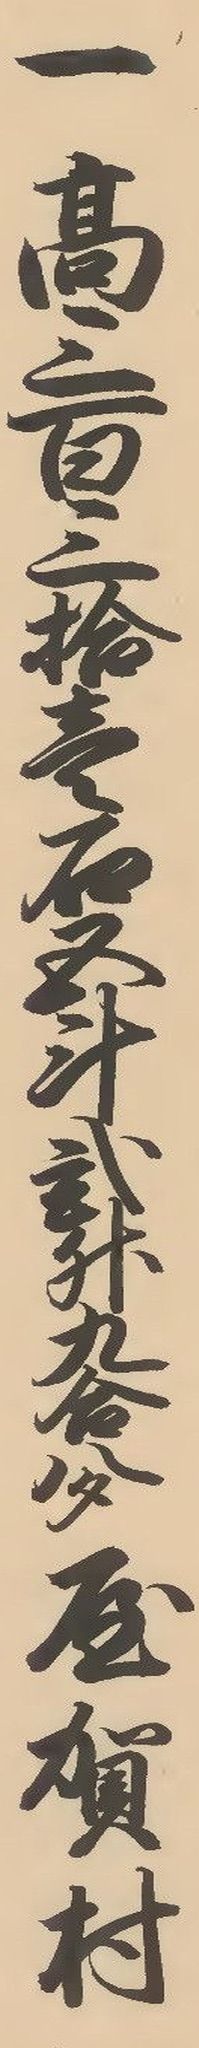一高三百三拾壱石五斗弐升九合八勺屋賀村
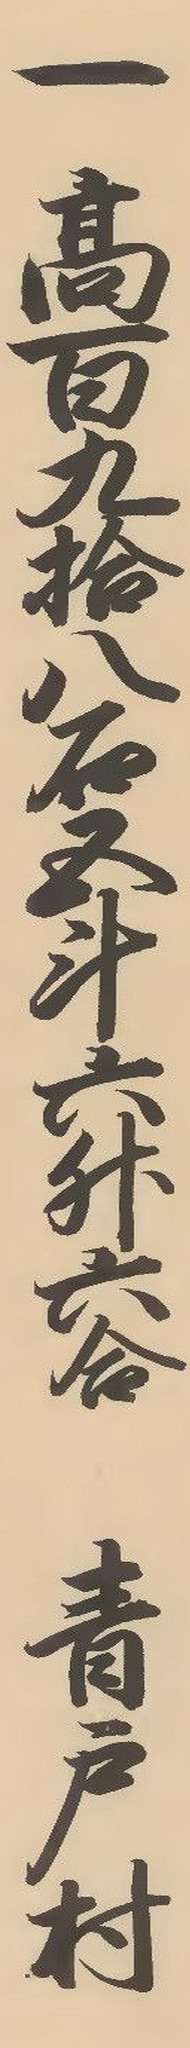一高百九拾八石五斗六升六合青戸村
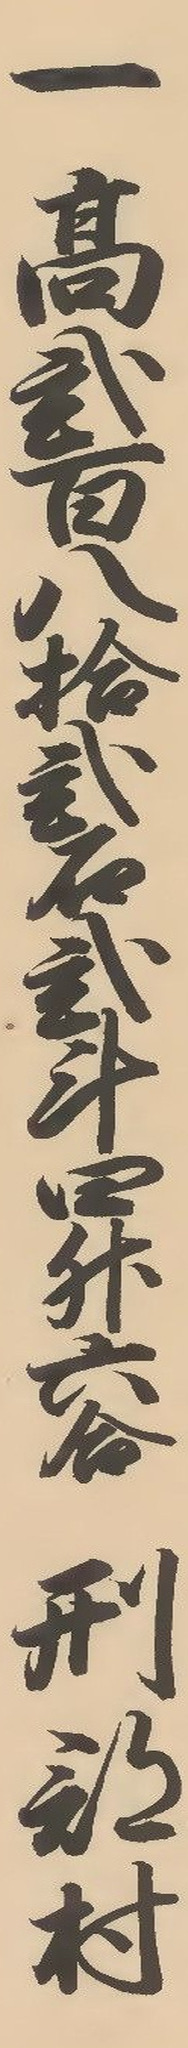一高弐百八拾弐石弐斗四升六合刑部村
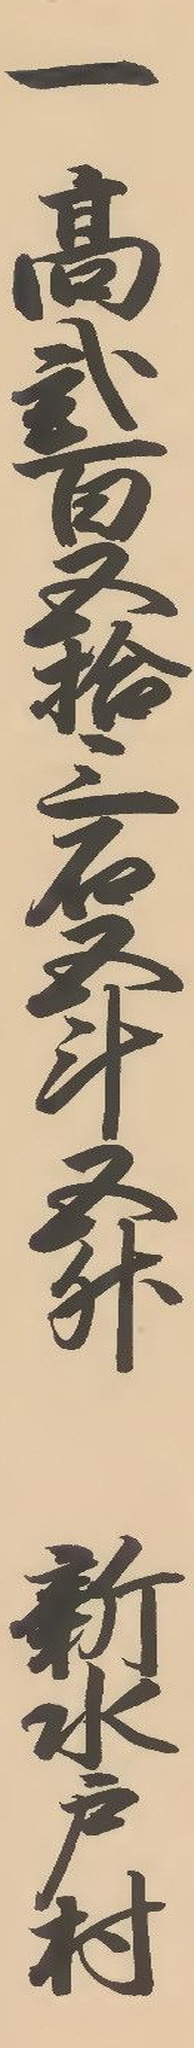一高弐百五拾三石五斗五升新水戸村
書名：丹波国郷帳
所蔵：国立公文書館 National Archives of Japan
